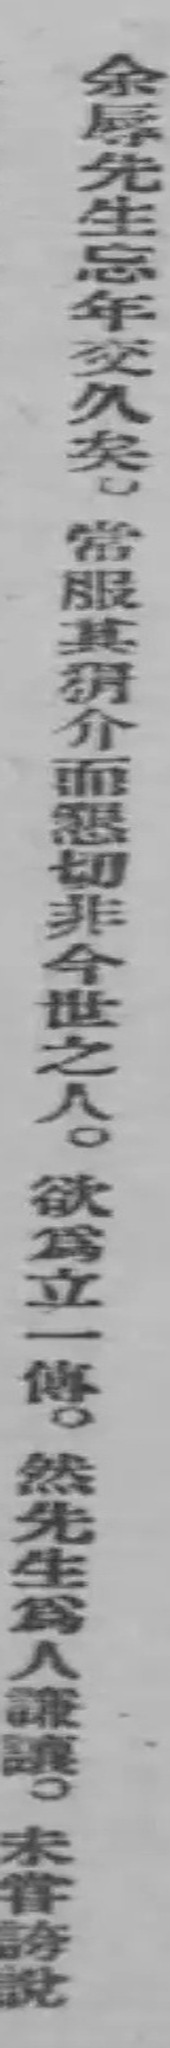余辱先生忘年交久矣。常服其狷介而懇切非今世之人。欲為立一伝。然先生為人謙譲。未嘗誇説
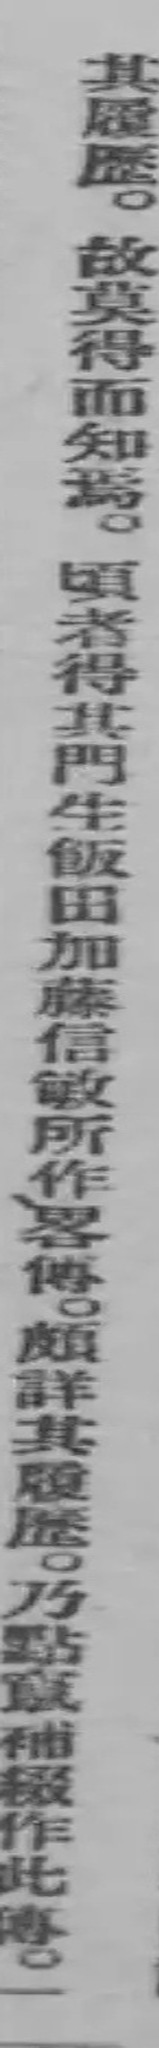其履歴。故莫得而知焉。頃者得其門飯田加藤信敏所作略伝。頗詳其履歴。乃点竄補綴作此伝。」
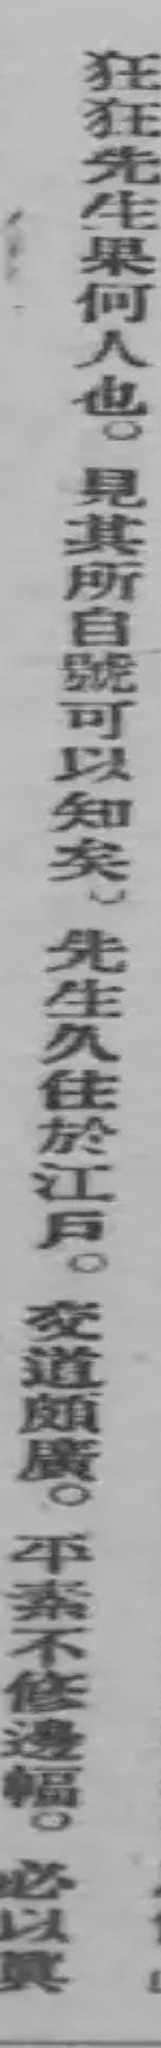狂狂先生果何人也。見其所自号可以知矣。先生久住於江戸。交道頗広。平素不修辺幅。必以真
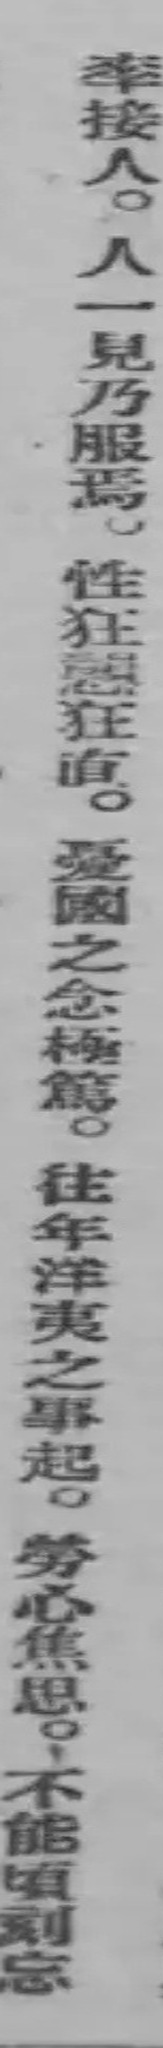率接人。人一見乃服焉。性狂慇狂直。憂国之念極篤。往年洋夷之事起。労心焦思。不能頃刻忘
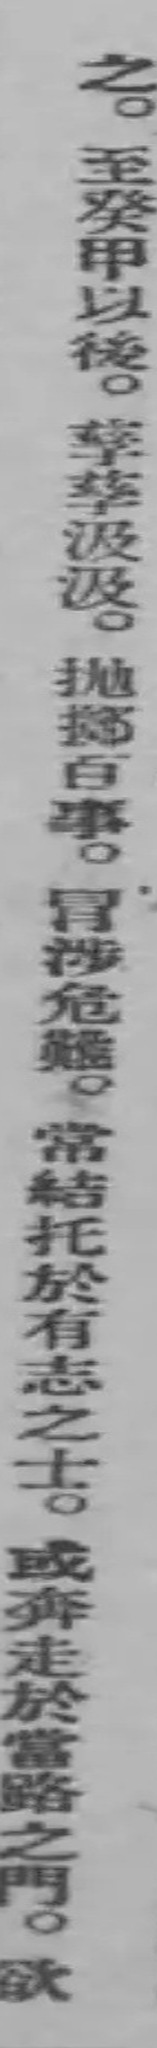之。至癸甲以後。孳孳汲汲。抛擲百事。冒渉危難。常結托於有志之士。或奔走於当路之門。欲
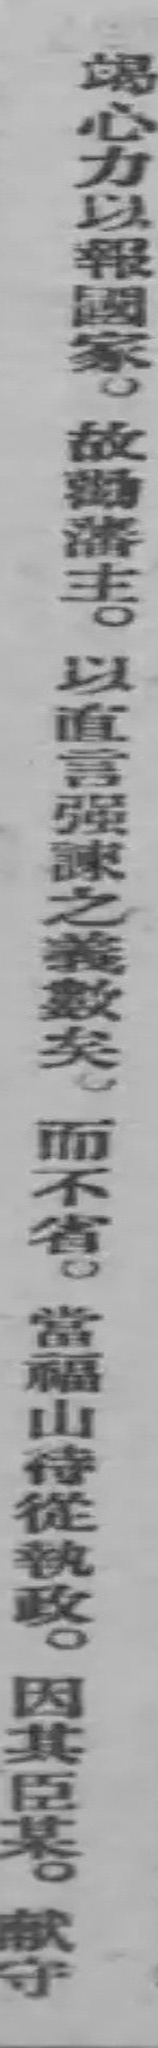竭心力以報国家。故勤藩主。以直言強諌之義数矣。而不省。当福山待従執政。因其臣某。献守
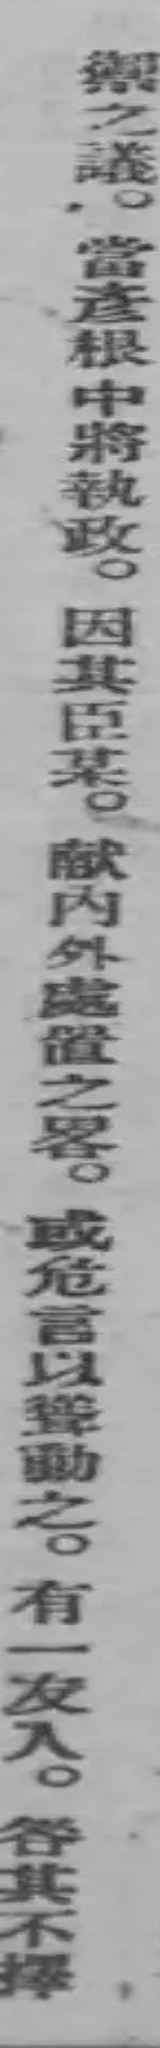禦之義。当彦根中将執政。因其臣某。献内外処置之略。或危言以聳動之。有一友人。咎其不摔
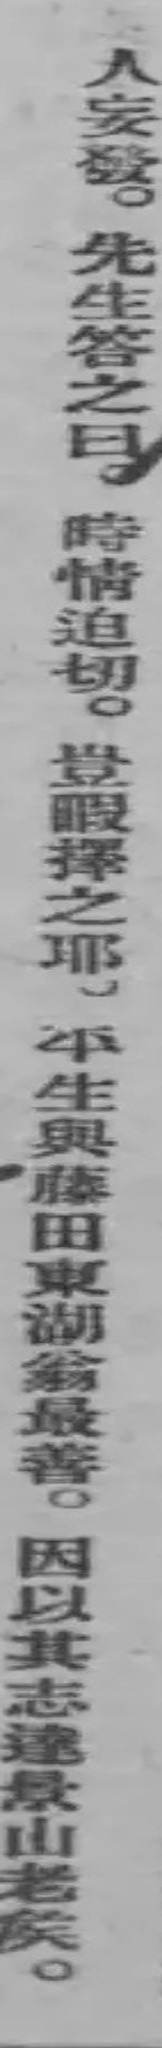人妄発。先生答之曰。時情迫切。豈暇擇之耶。平生與藤田東湖翁最善。因以其志達景山老矦。
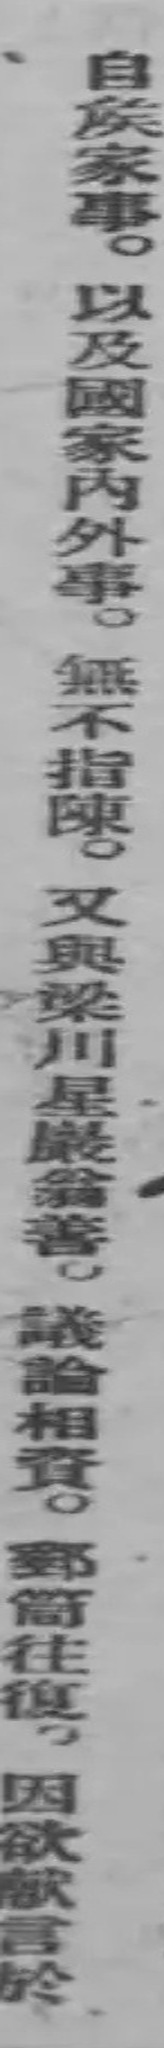自矦家事。以及国家内外事。無不指陳。又與梁川星嚴翁善。議論相資。郵筒往復。因欲献言於
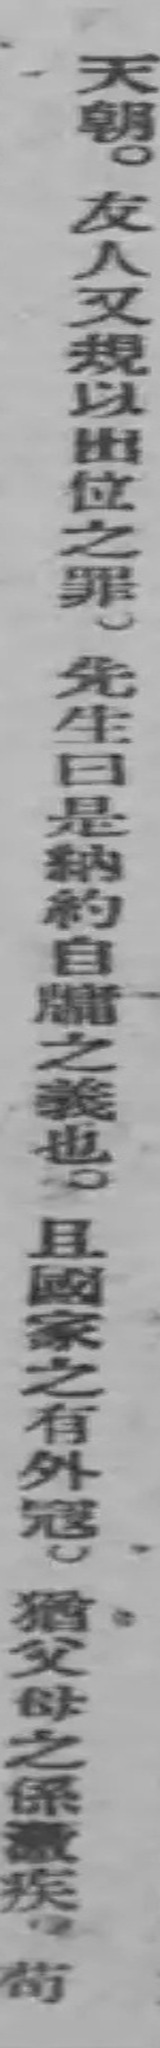天朝。友人又規以出位之罪。先生曰是納約自牖之義也。且国家之有外寇。猶父母之係激疾。苟
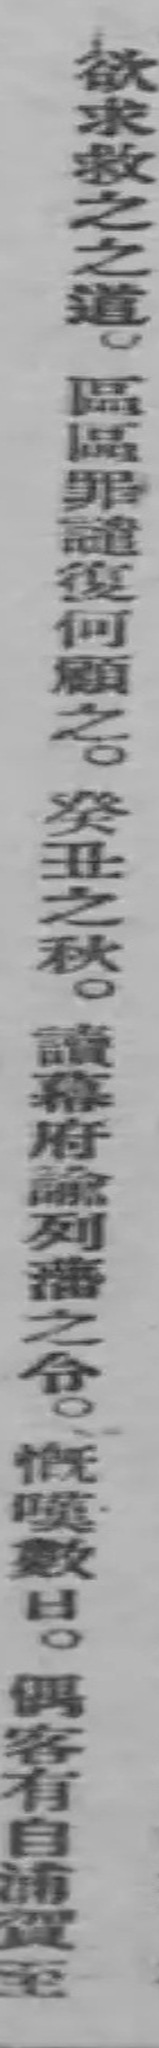欲求救之之道。区区罪譴復何顧之。癸丑之秋。読幕府論列藩之令。慨嘆数日。偶客有自浦賀至
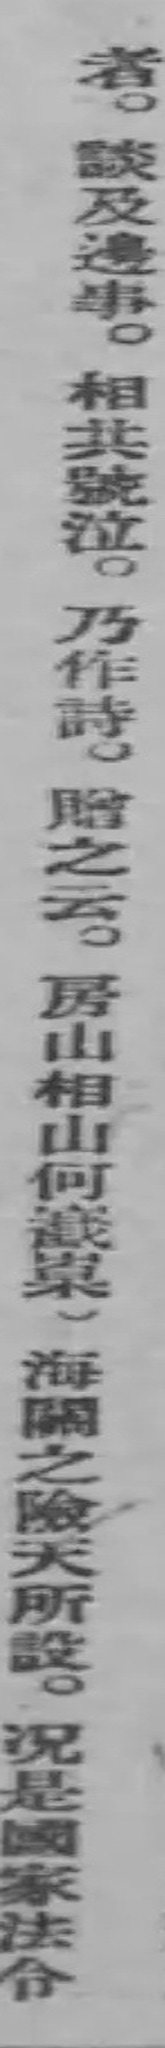者。談及辺事。相共号泣。乃作詩。贈之云。房山相山何。海関之険天所設。況是国家法令
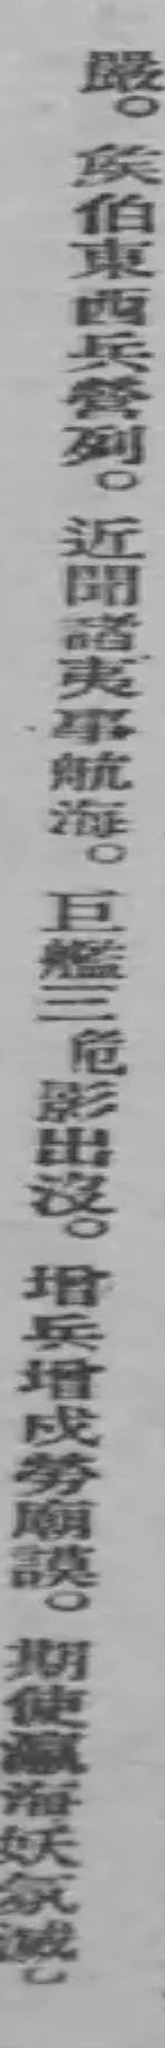厳。矦伯東西兵営列。近聞諸夷事航海。巨艦三危影出没。増兵増戌労廟謨。期使瀛海妖氛滅。
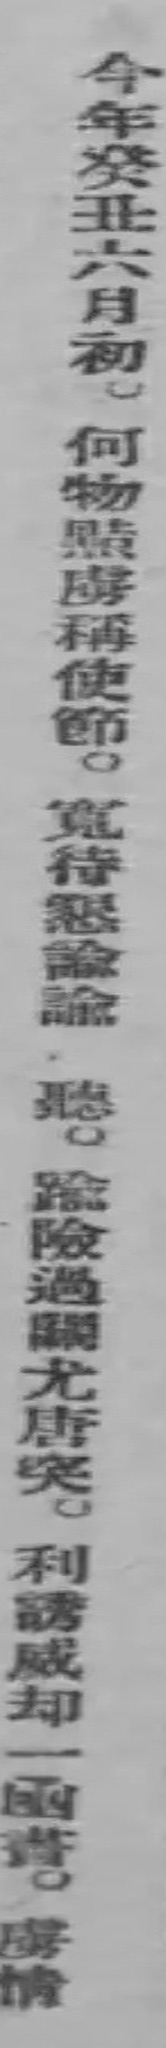今年癸丑六月初。何物点虜称使節。寛待懇論諭聴。踰険過関尤唐突。利誘威却一函書。虜情
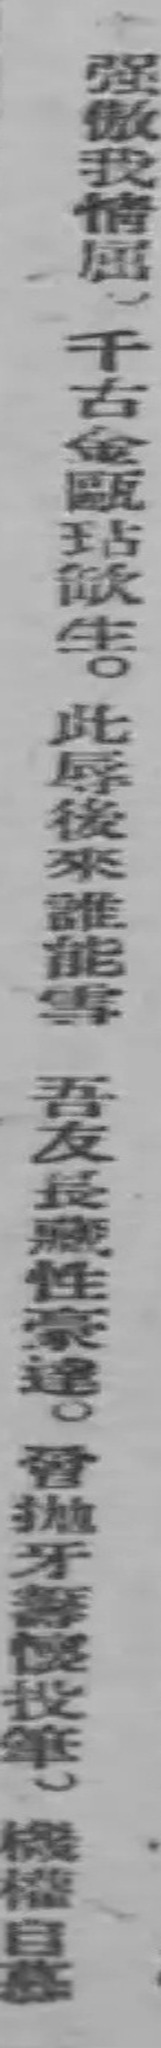強倣我情屈。千古金甌玷缼生。此辱後来誰能雪。吾友長蔵性豪達。嘗抛牙籌懐投筆。機権自慕
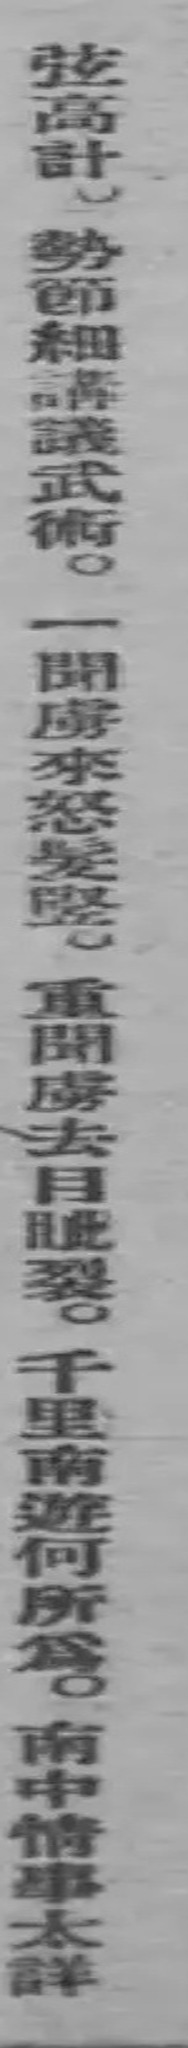弦高計。勢節細講議武術。一聞虜来怒髪堅。重聞虜去目眦裂。千里南遊何所為。南中情事太詳
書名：豊橋市史談
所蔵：国立国会図書館 National Diet Library, JAPAN
